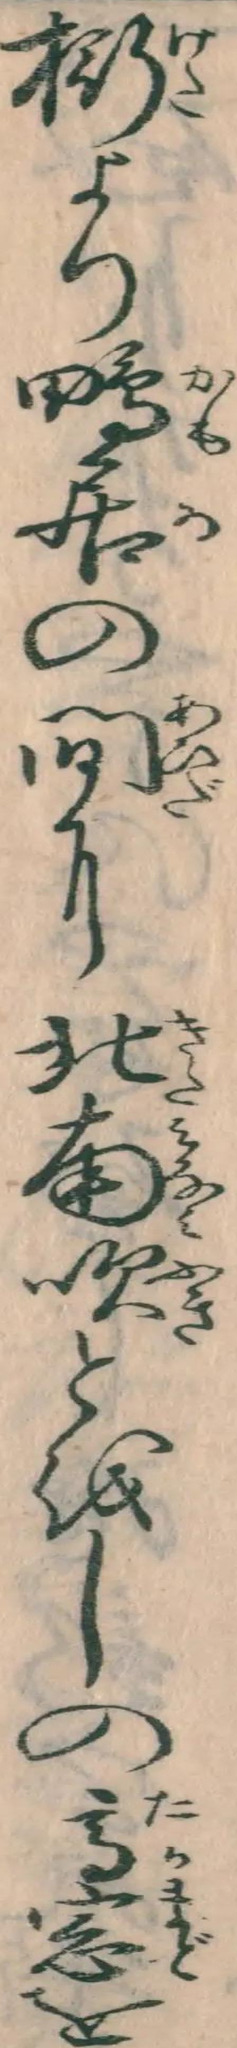桁より鴨居の間に北南吹とをしの高窓を
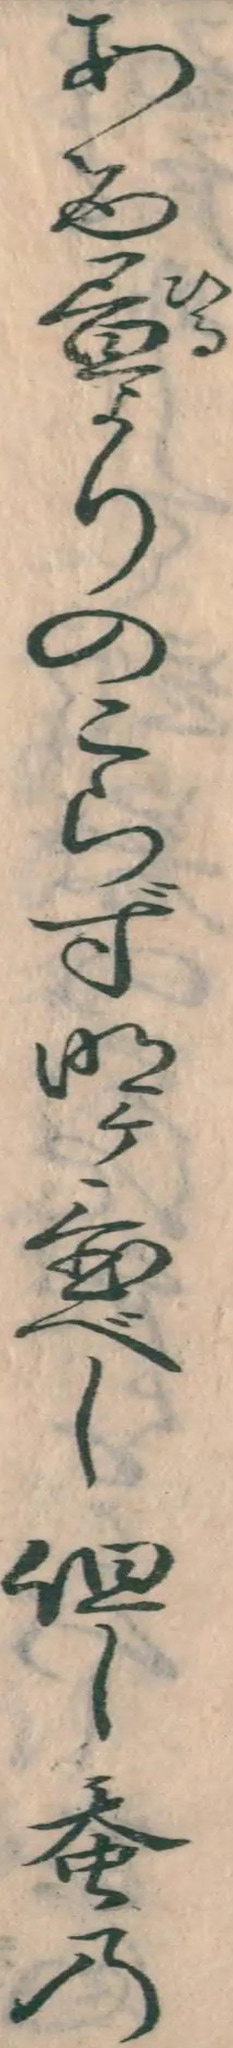あけ昼よりのこらず明け置べし但し蚕の
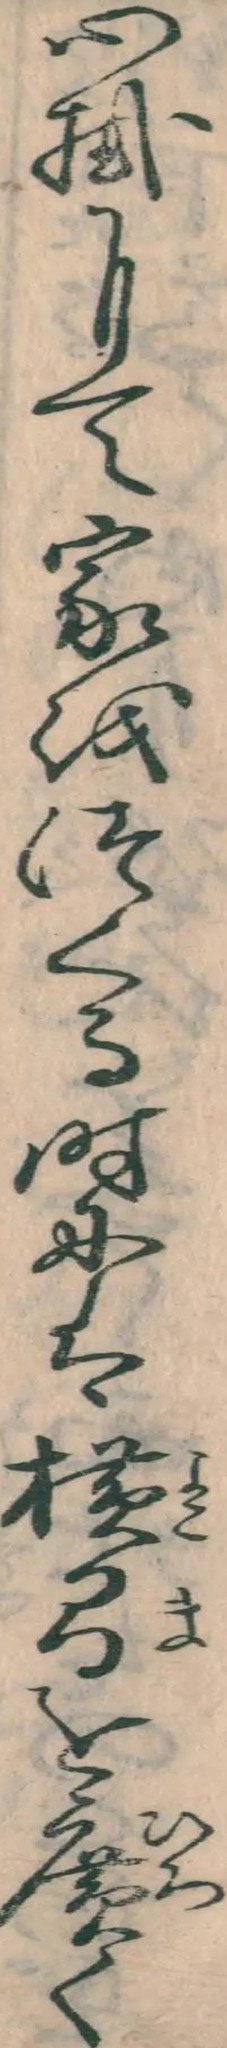心掛にて家をつくる時には横間を広く

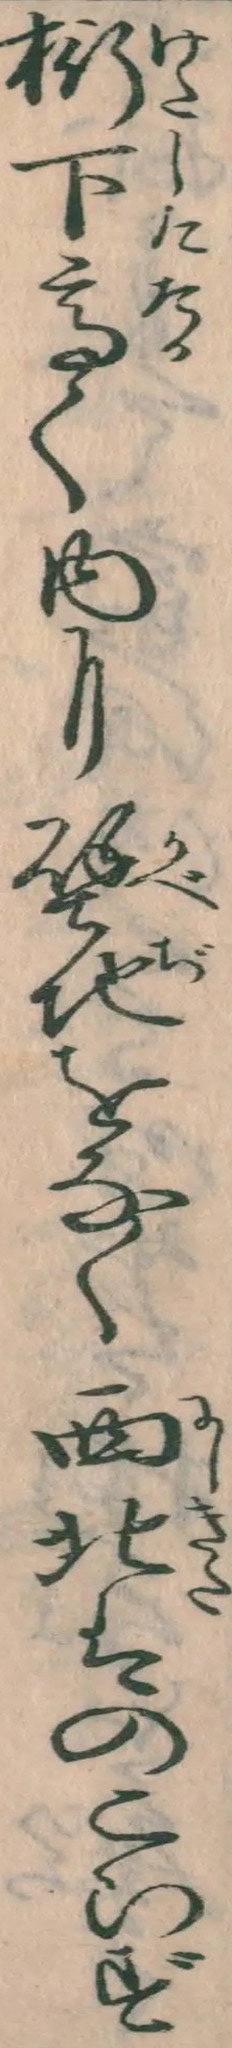桁下高く内に壁地をなく西北はのこらず
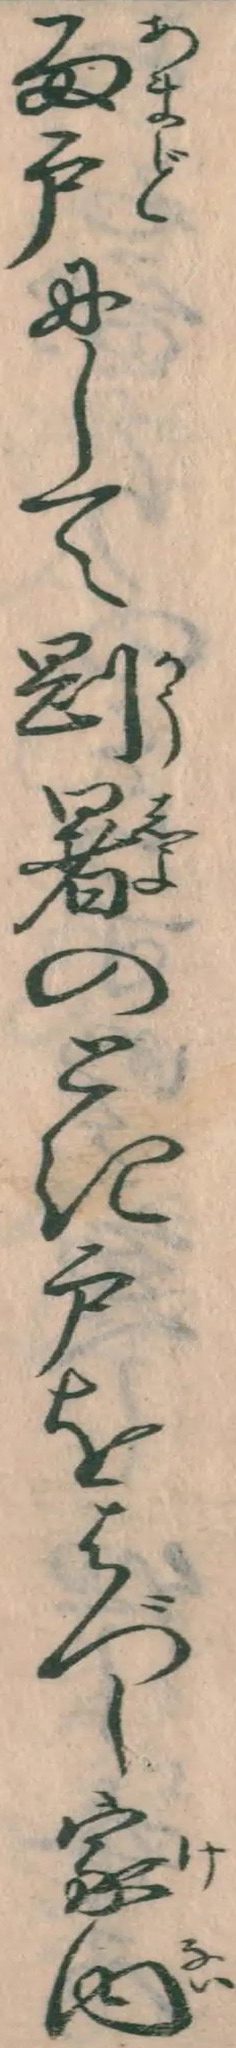雨戸にして剛暑のとき戸をはづし家内
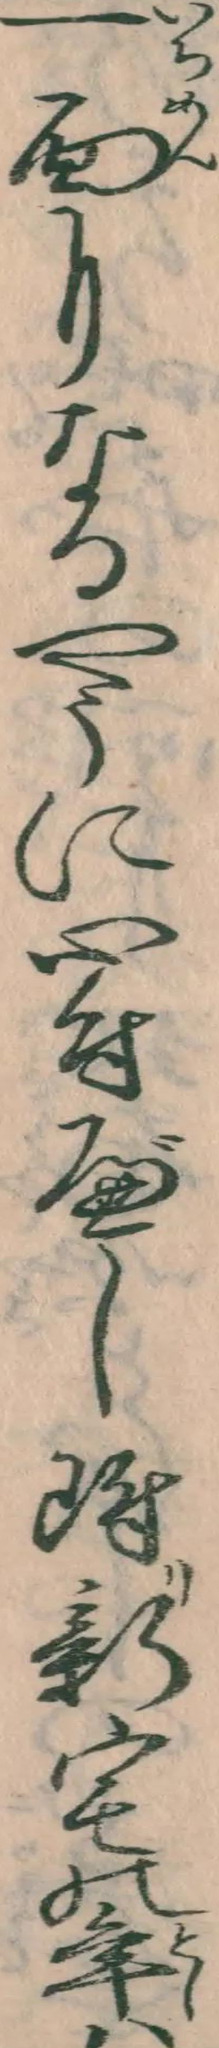一面になるやうに心付べし附り新宅の年は
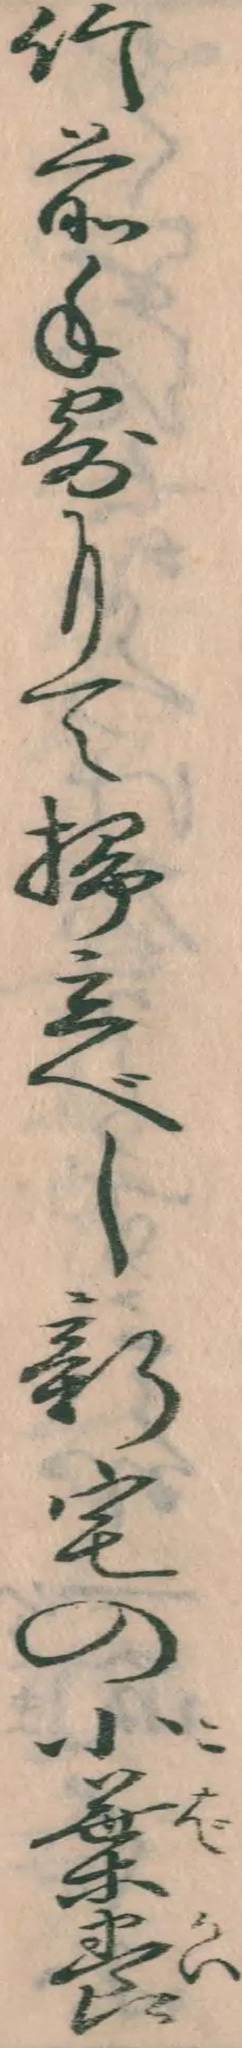竹前手寄にて掃立べし新宅の小葉養
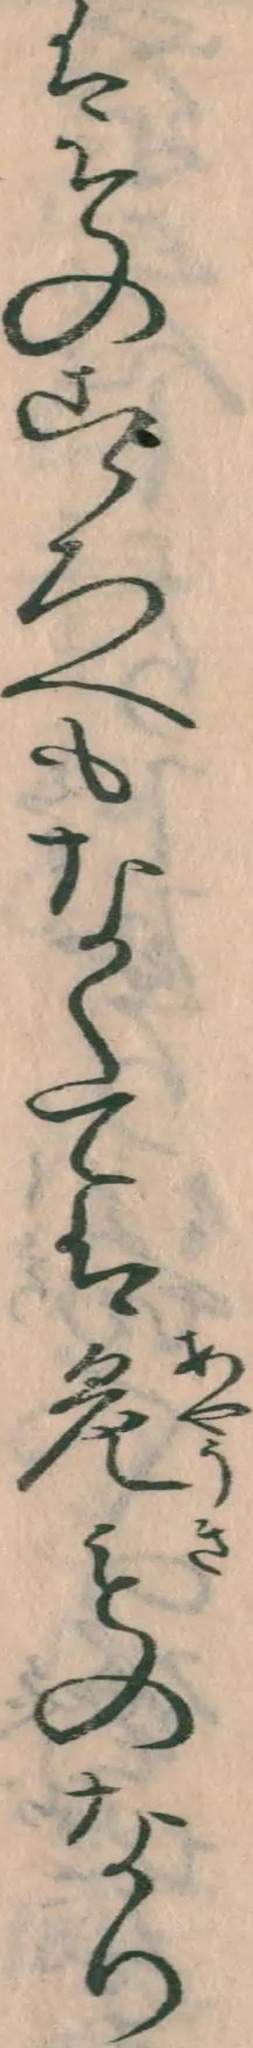はそのこゝろへもなくては危ものなり
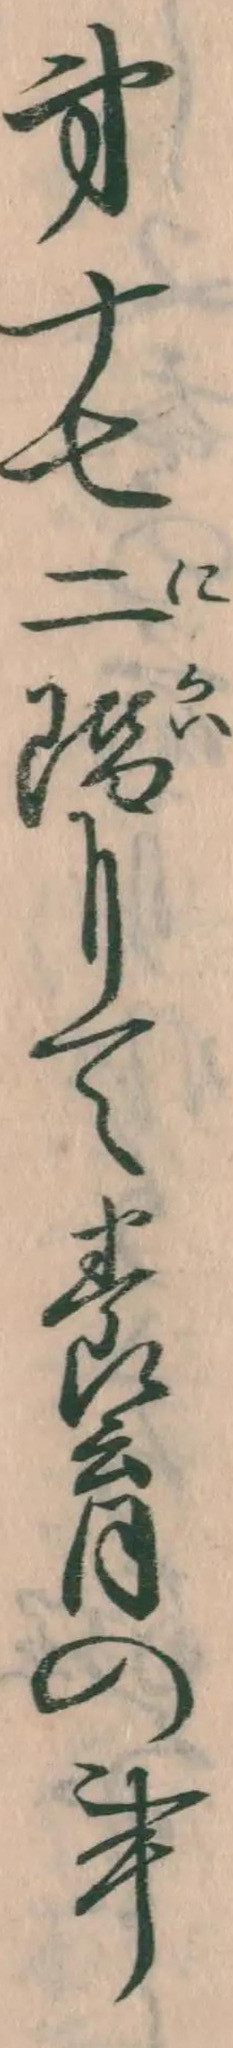第十七二階にて養育の事
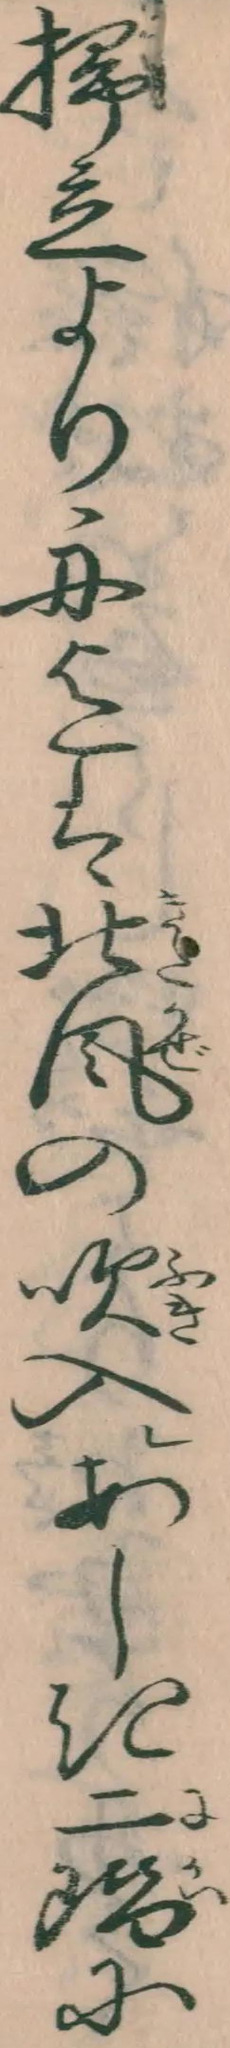掃立より舟迄は北風の吹入れあしき二階に
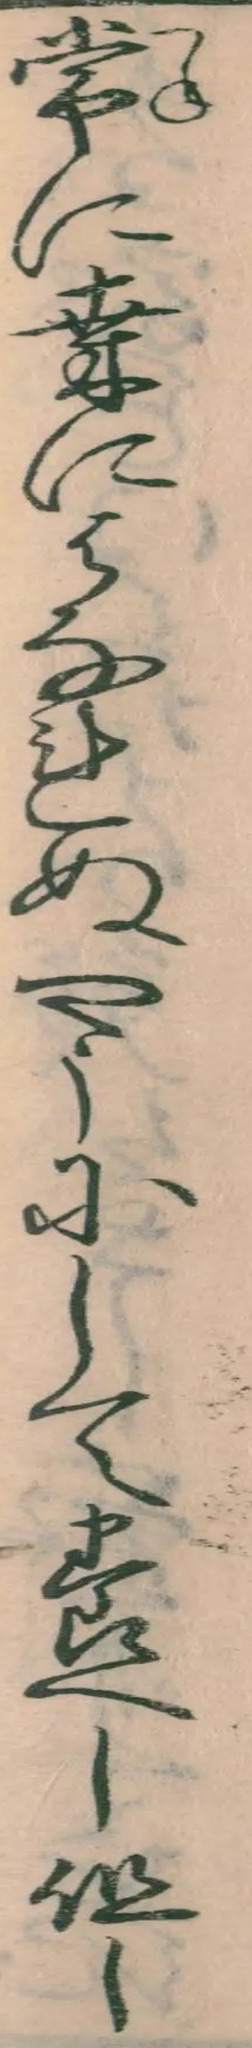常に桑にはなれぬやうにして養へし但し
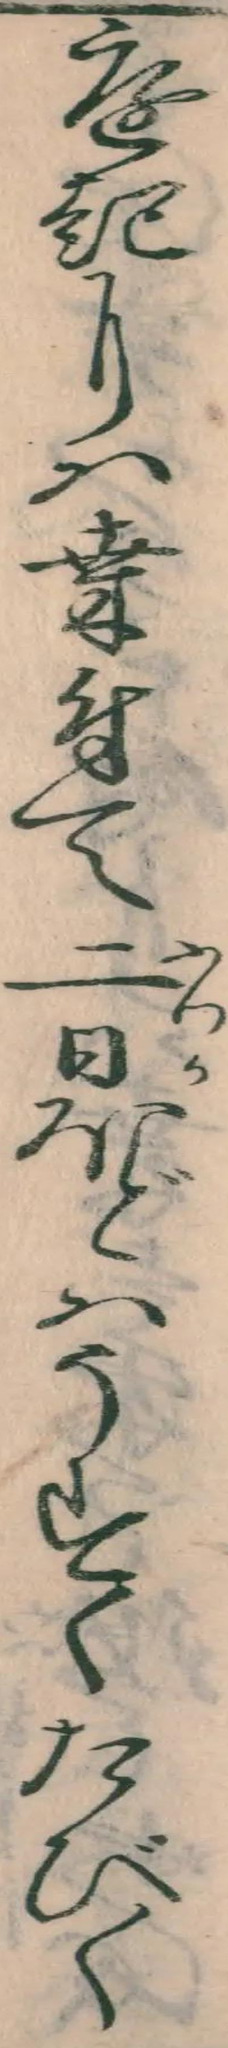庭起には桑付て二日ほどはうすくたび〳〵
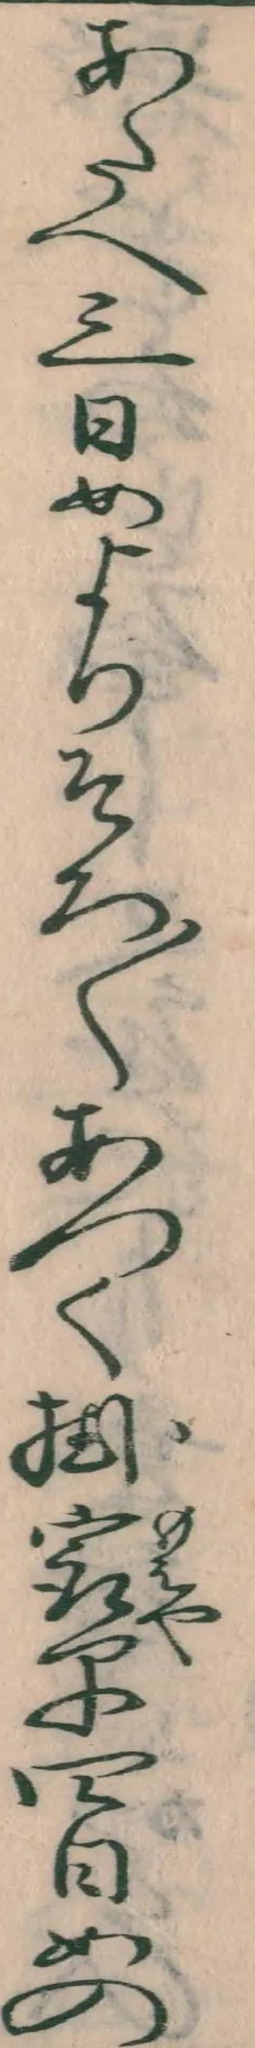あたへ三日めよりそろ〳〵あつく掛最早四日めの
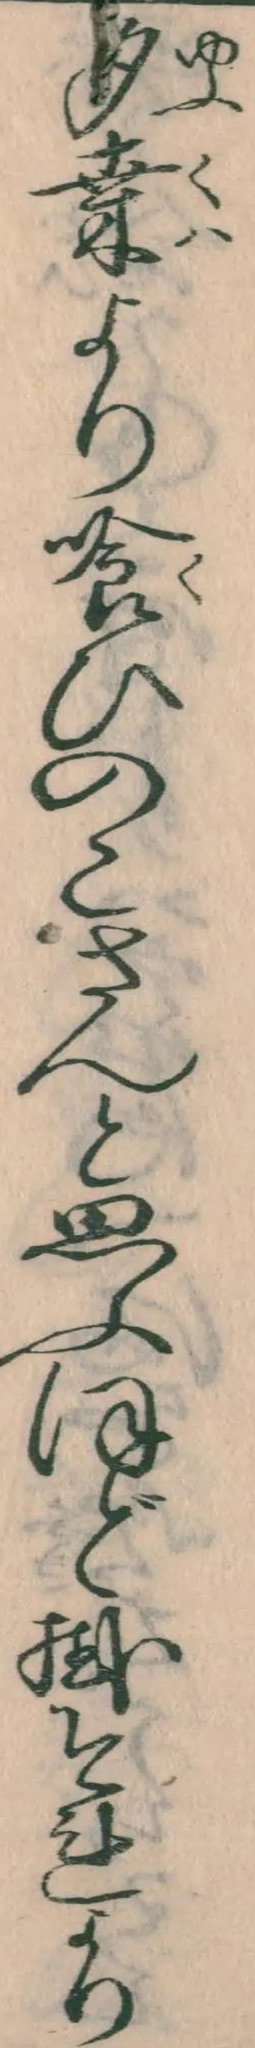夕桑より喰ひのこさんと思ふほど掛それより
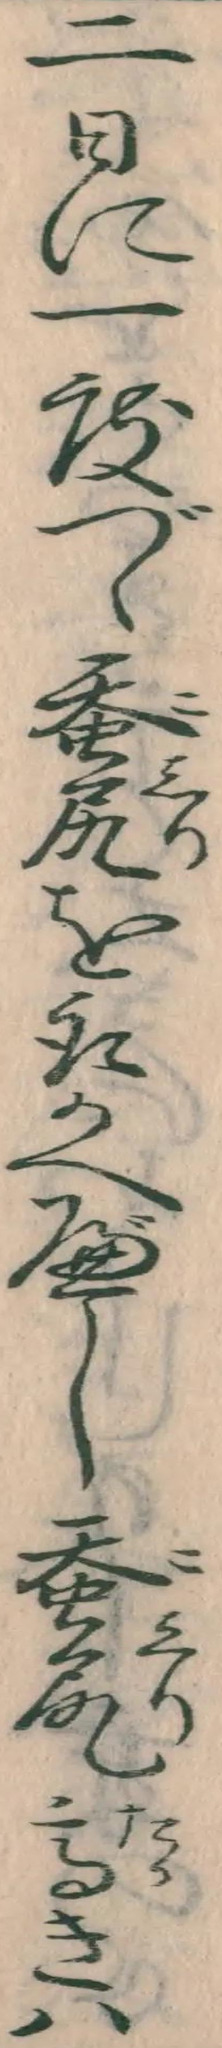二日に一度づゝ蚕尻を取かへべし蚕尻高きは
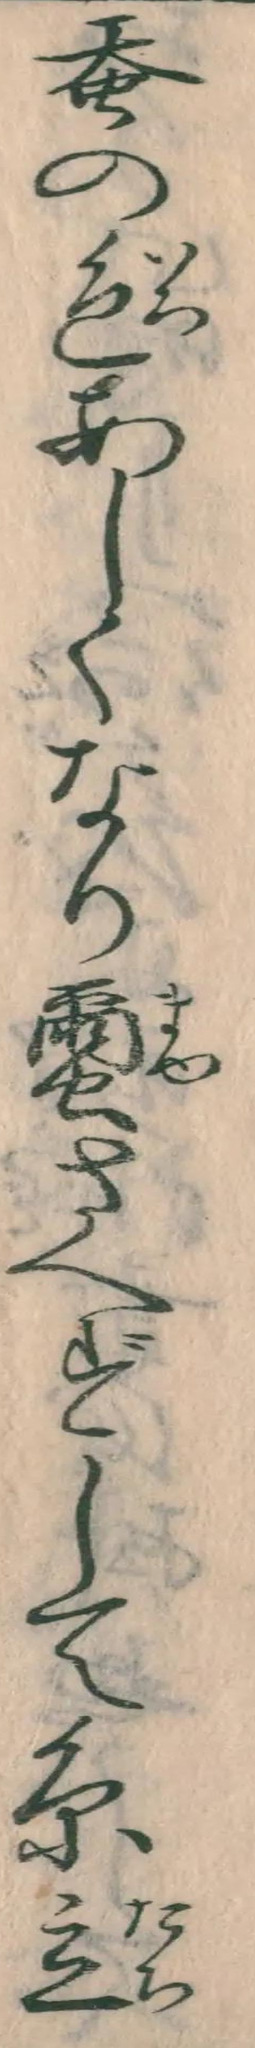蚕の色あしくなり繭さへずして糸立
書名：新撰養蚕秘書
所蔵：国立国会図書館 National Diet Library, JAPAN
